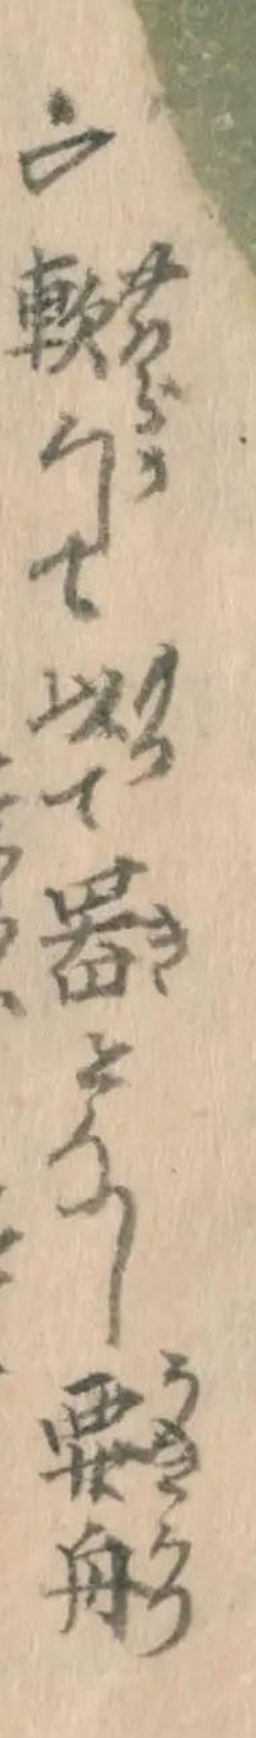●○軟くして以て器となし要舟
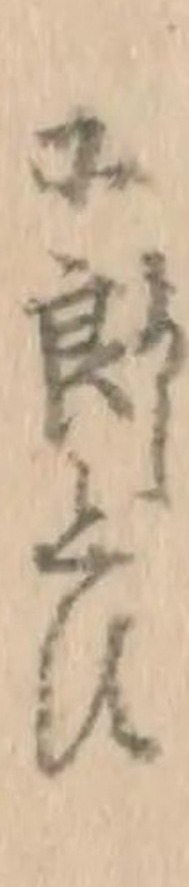に良とす

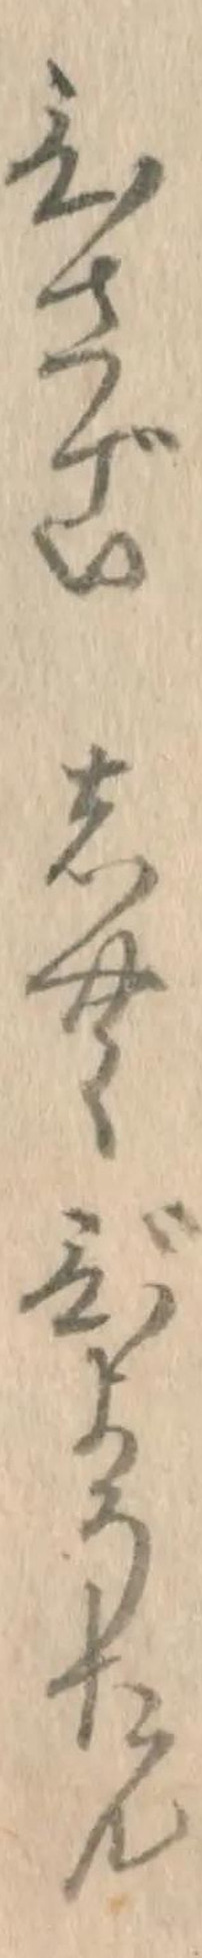ひさごしやくびようたん
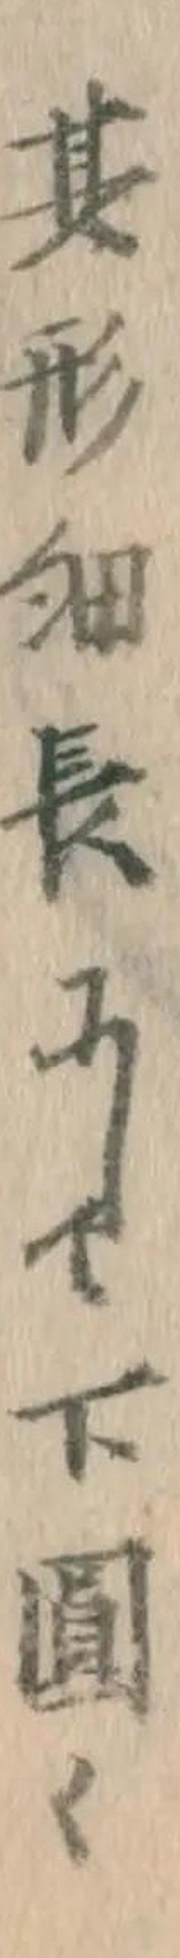其形細長にして下円く
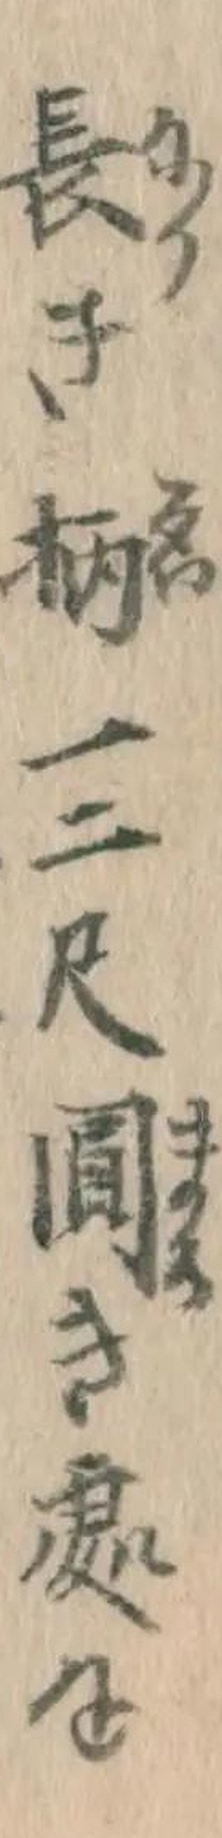長き柄一二尺円き処を
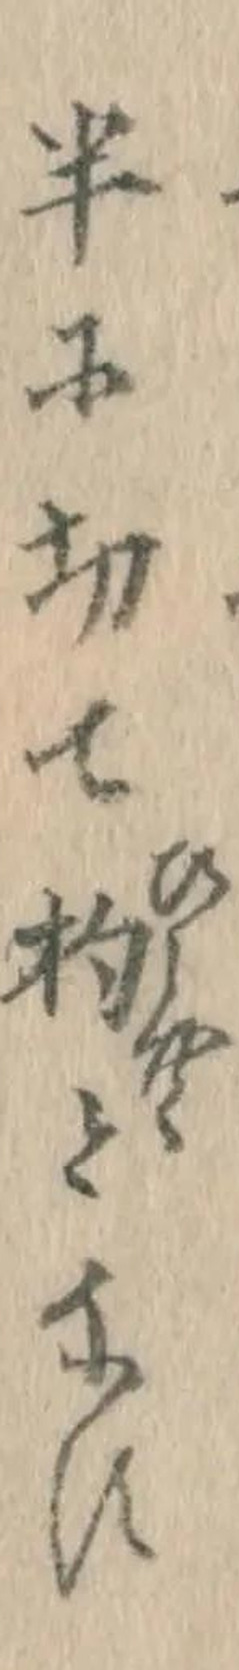半に切て杓となす

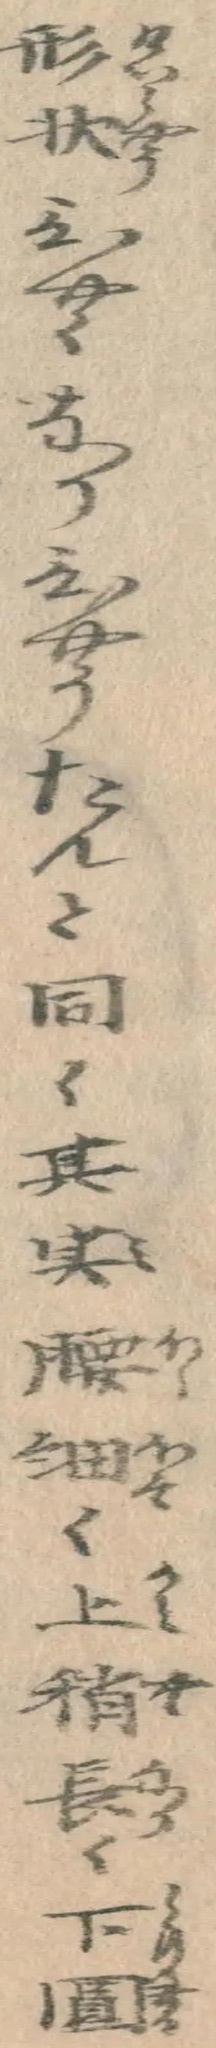形状ひやくなりひやうたんと同く其実腰細く上稍長く下円
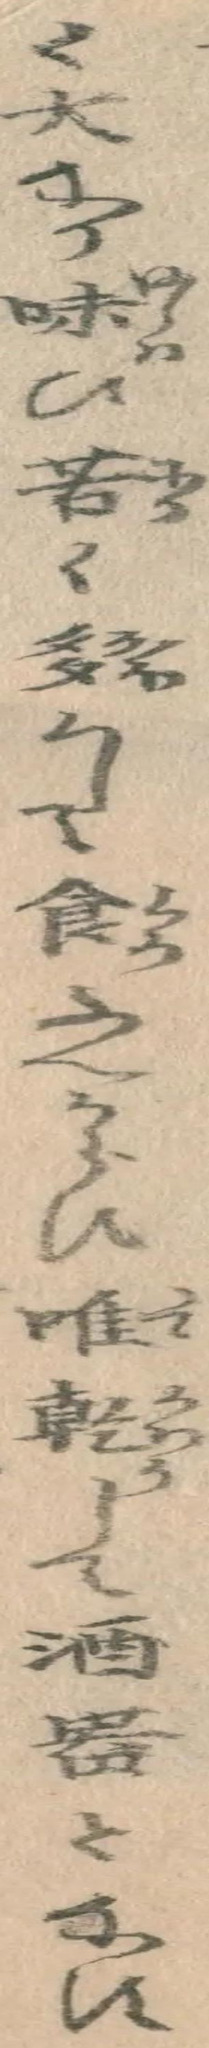く大なり味ひ苦く多くして食ふへからす唯乾して酒器となす
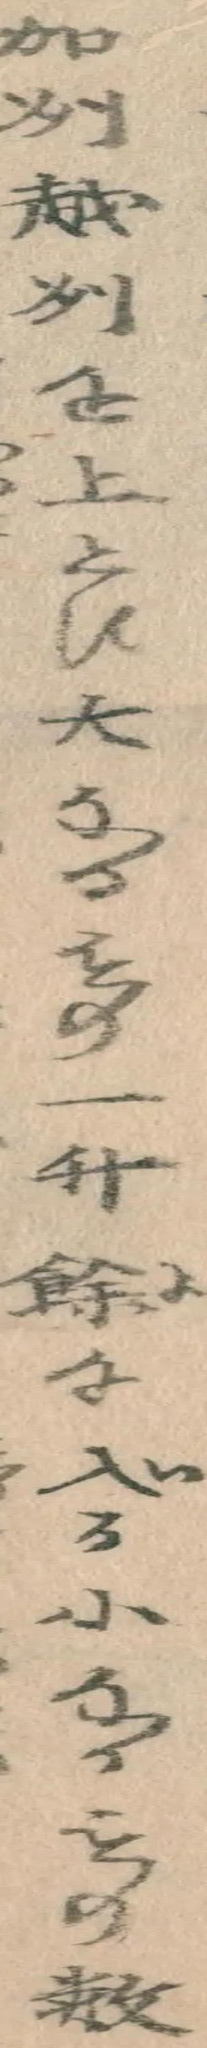加州越州を上とす大なるもの一升余を入る小なるもの数
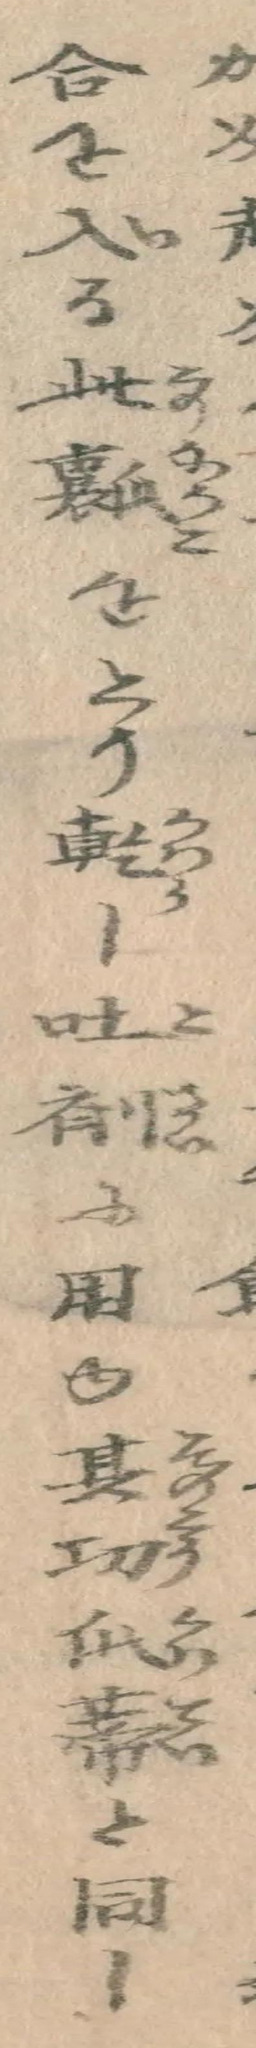合を入る此瓤をとり乾し吐剤に用ゆ其功瓜蒂と同し
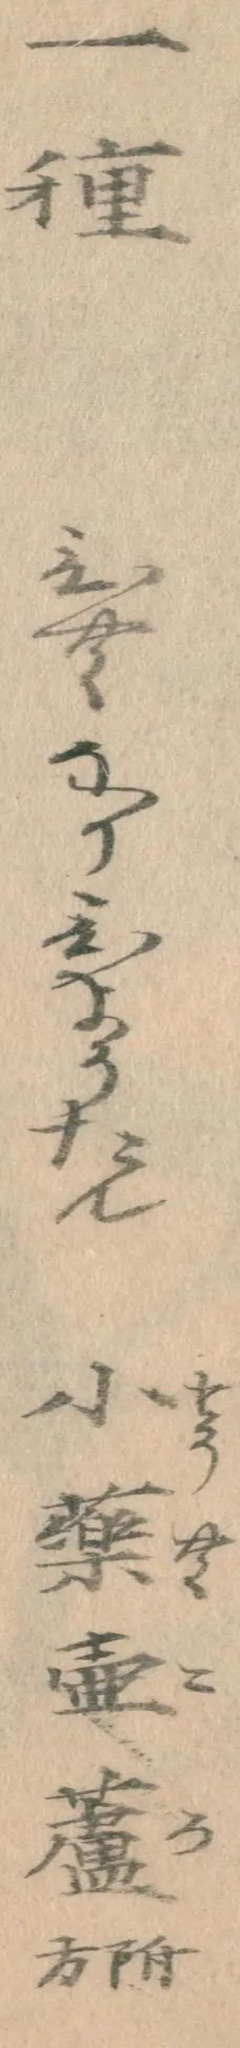一種ひやくなりひようたん小薬壺蘆附方
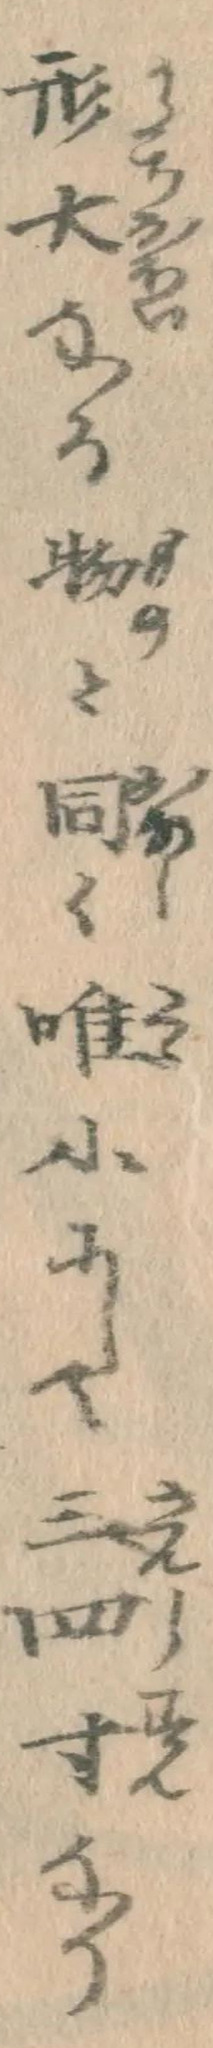形大なる物と同く唯小にして三四寸なり
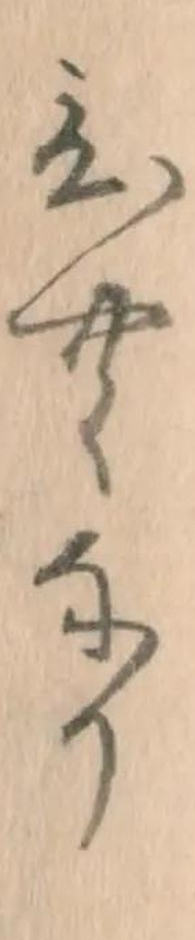ひやくなり
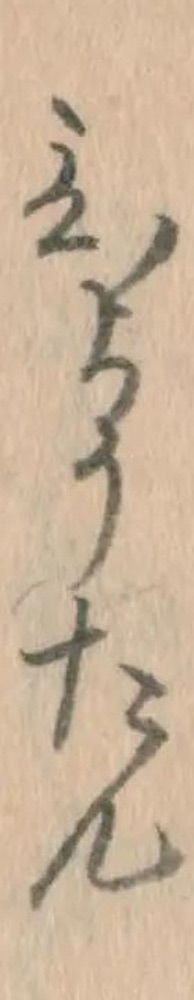ひようたん

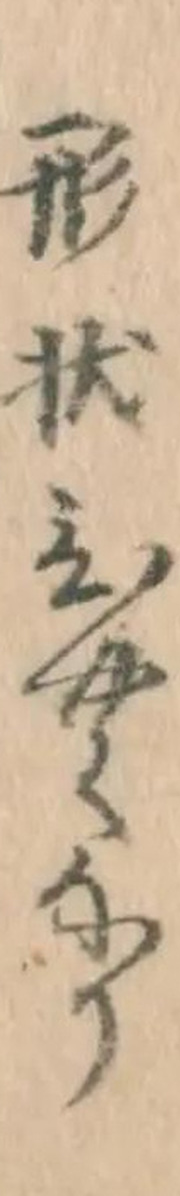形状ひやくなり
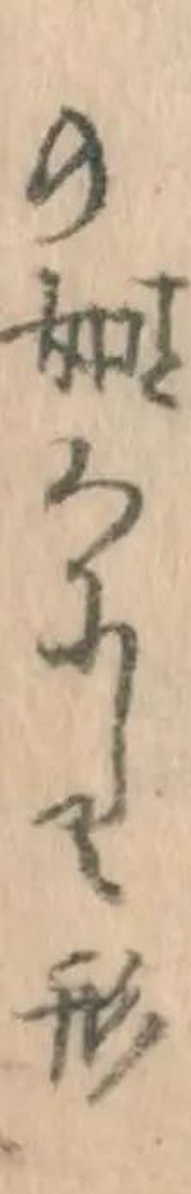の如くにして形
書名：本草図譜. 巻52-54
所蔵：国立国会図書館 National Diet Library, JAPAN
